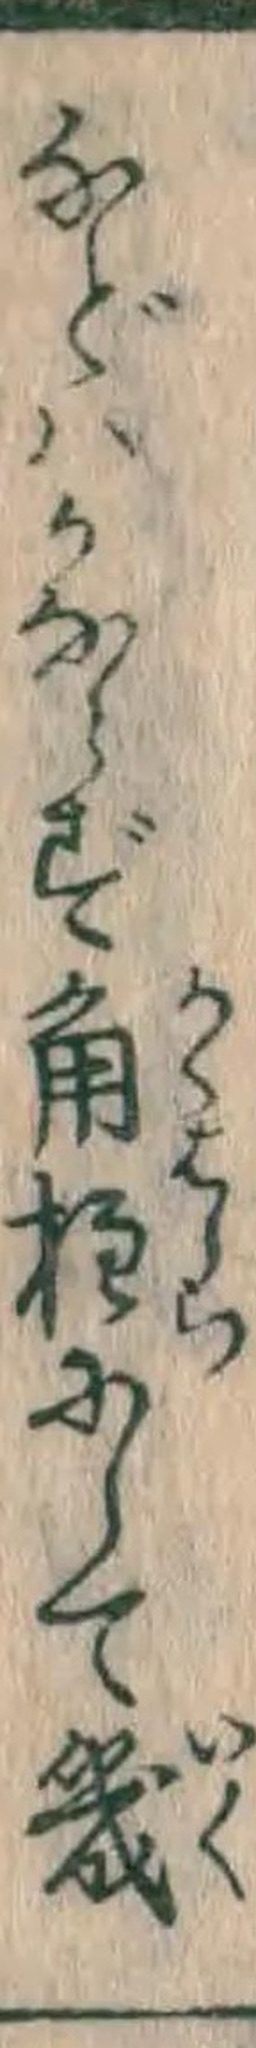などはかならず角柱にして幾
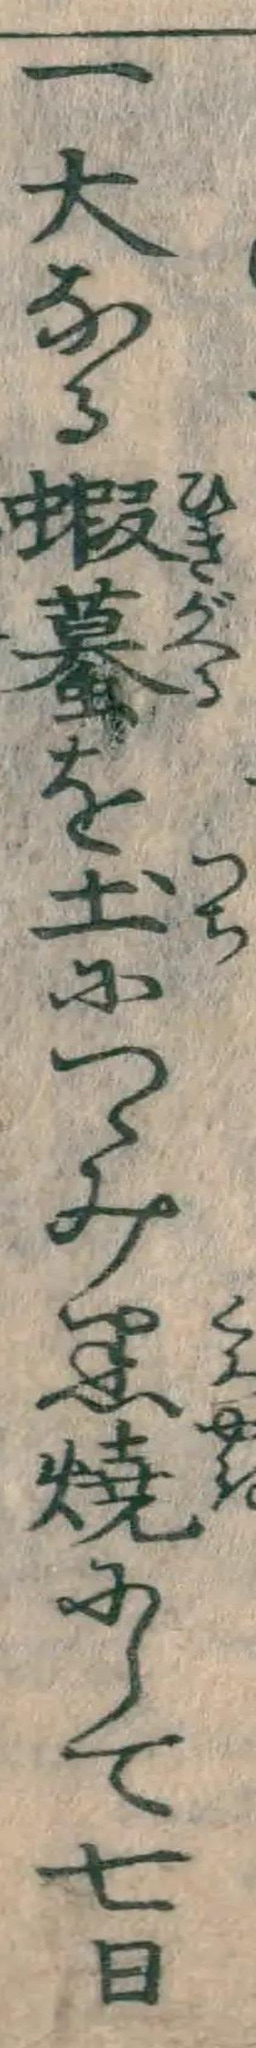一大なる蝦蟇を土につゝみ黒焼にして七日
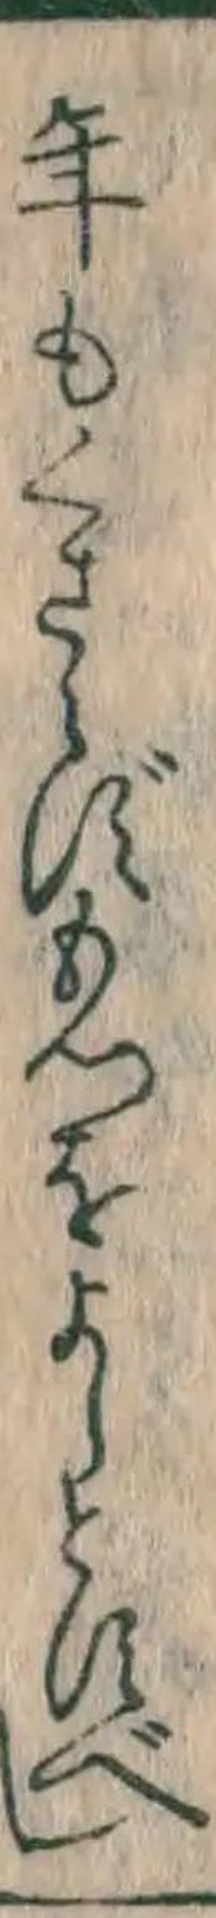年もくさらずもつをよしとすべし
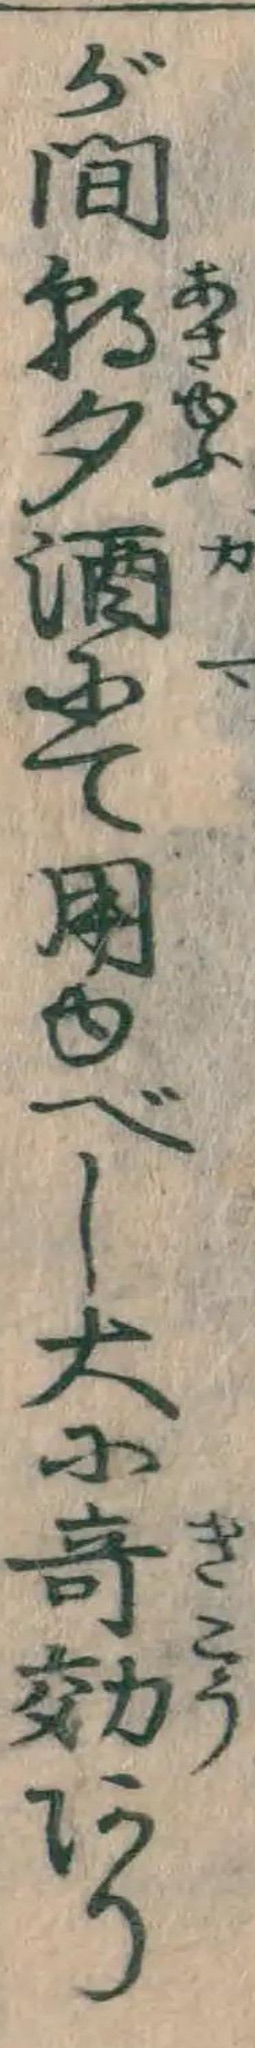が間朝夕酒にて用ゆべし大に奇効あり

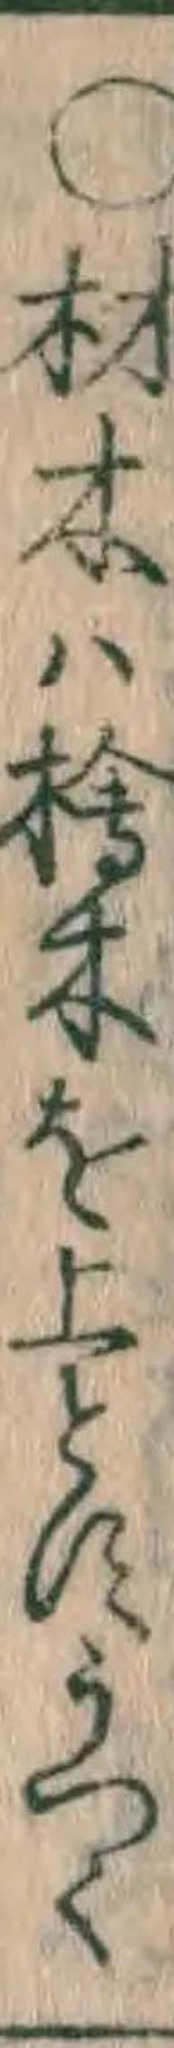○材木は檜木を上とすうつく
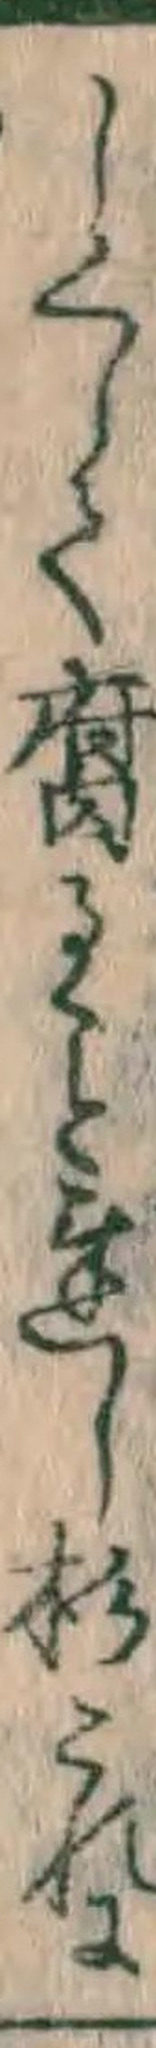しくして腐ること遅し杉これに
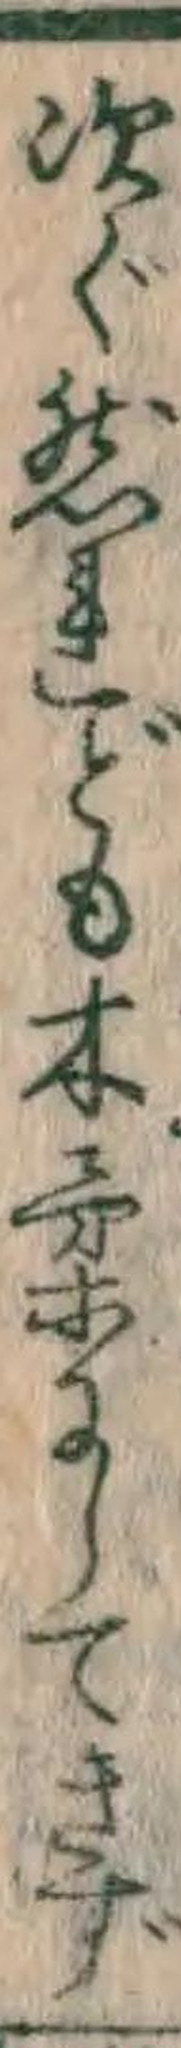次ぐ然れども木柔にしてきず
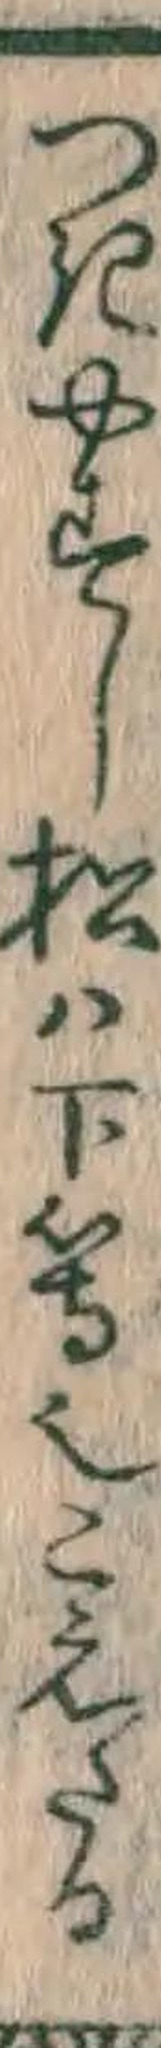つきやすし松は下等也こえたる
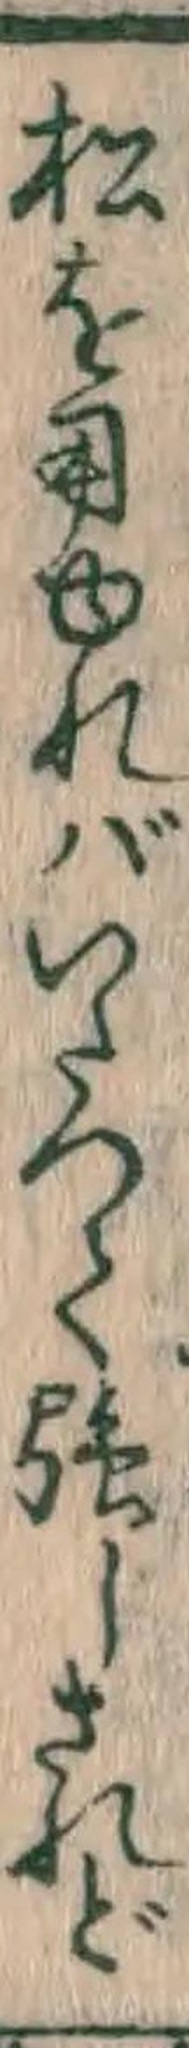松を用ゆればいたつて強しされど
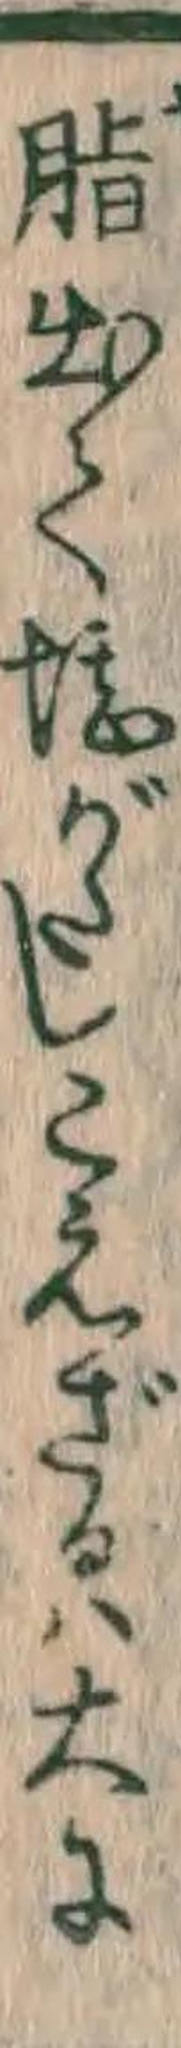脂出て堪がたしこえざるは大に
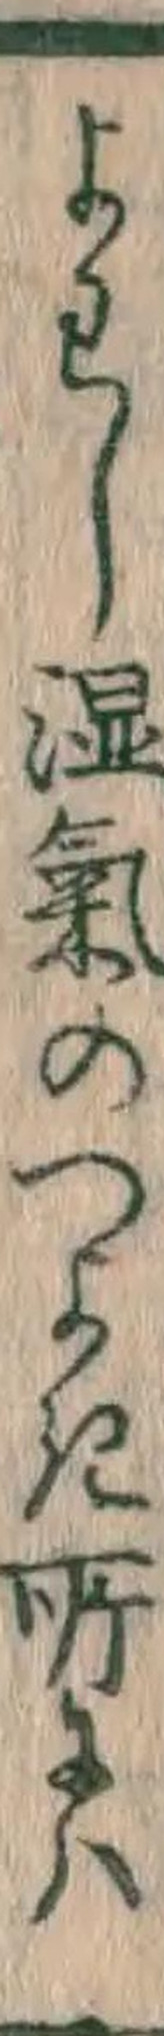よわし湿気のつよき所には
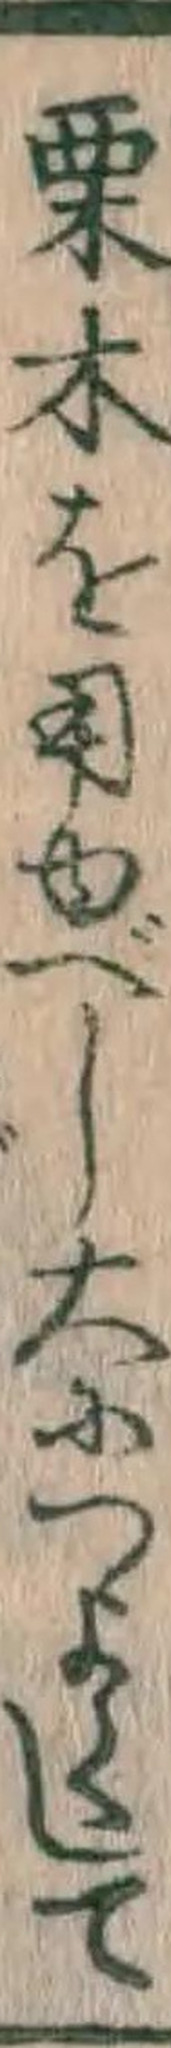栗木を用ゆべし大につよくして
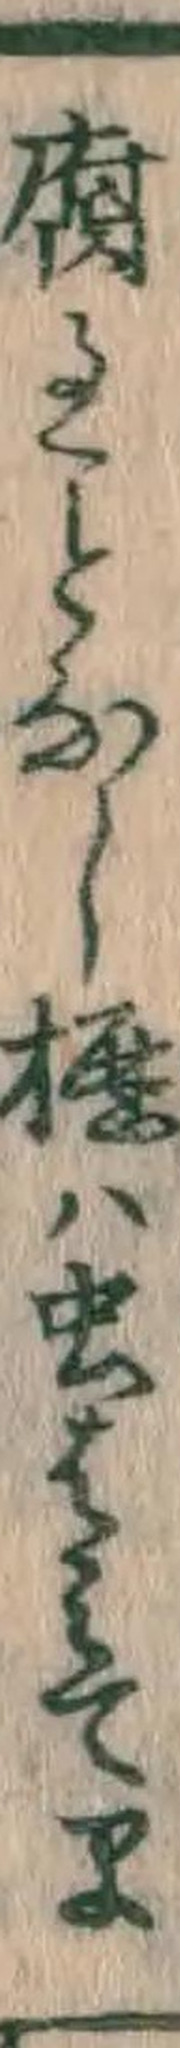腐ることなし櫪は虫はみて早
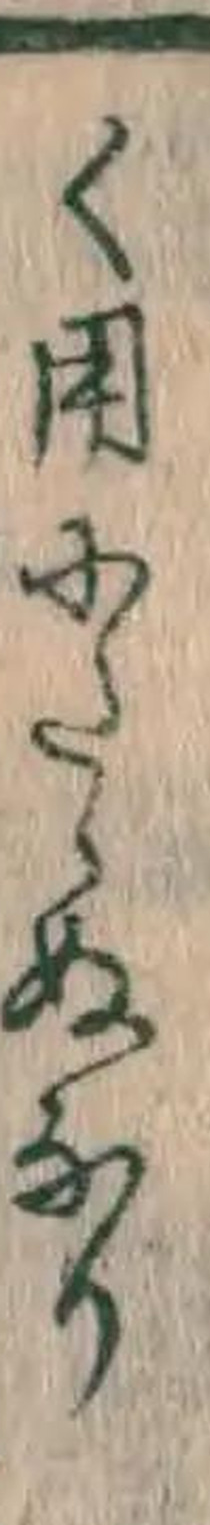く用にたゝぬなり
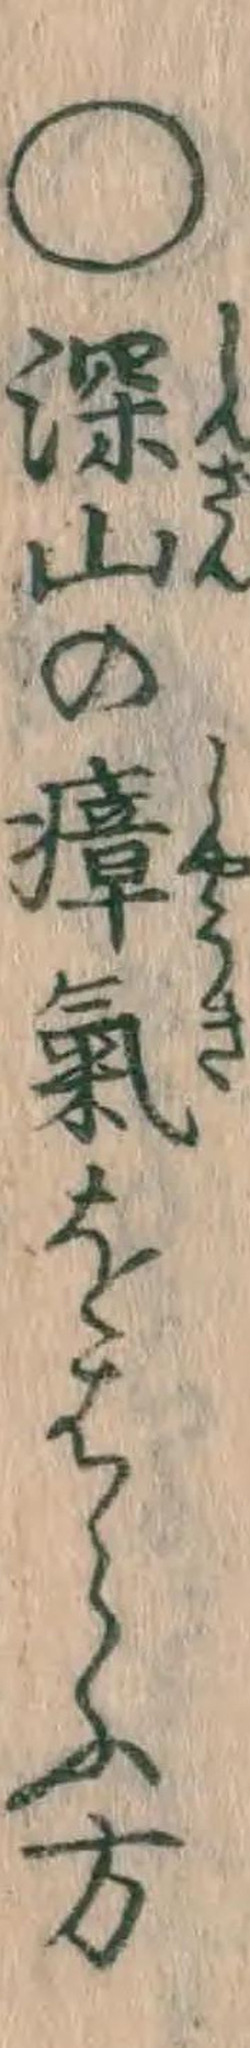○深山瘴気をはらふ方
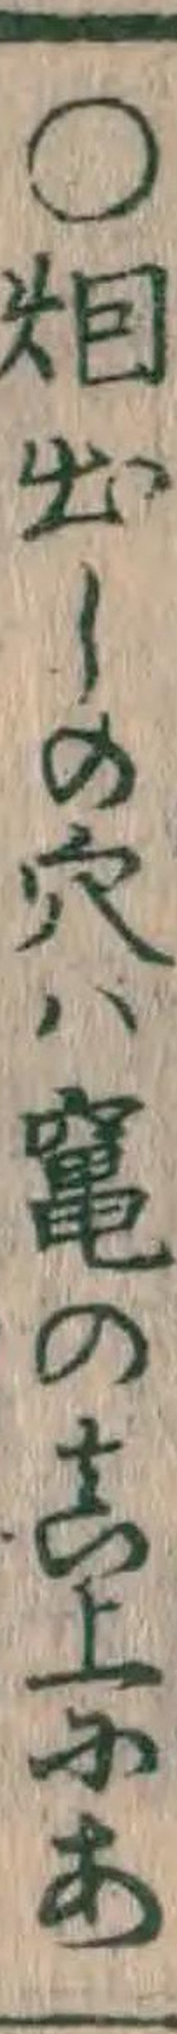○𤇆出しの穴は竈の真上にあ
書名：広益秘事大全 3巻. [3]
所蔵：国立国会図書館 National Diet Library, JAPAN
